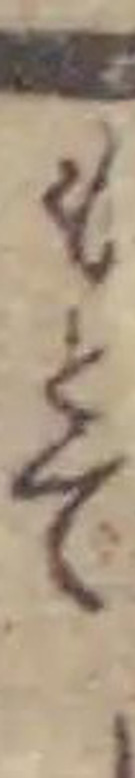もとて
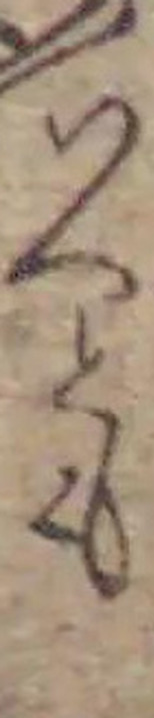いへとも
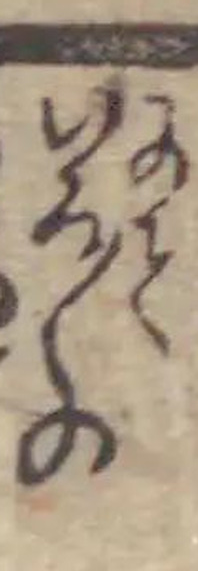いろ〳〵の
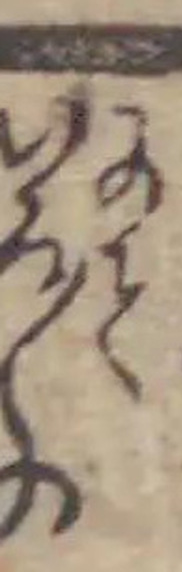いろ〳〵の
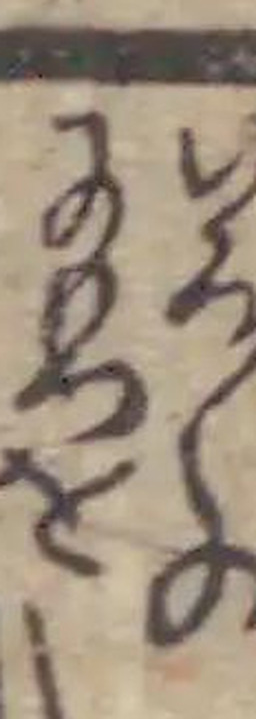にもつを
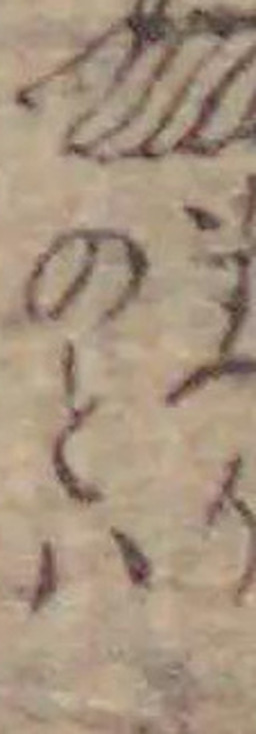のとは
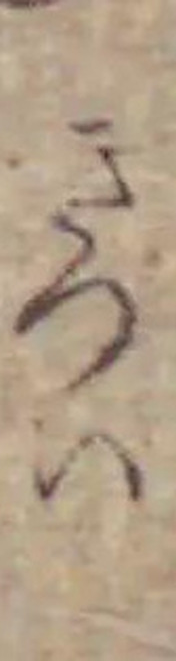きつい
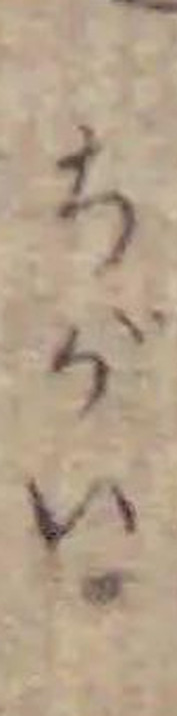ちがい
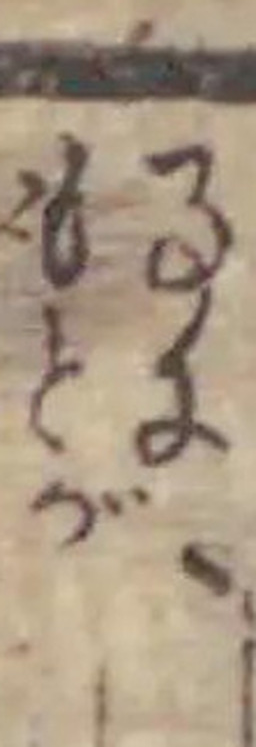もとが
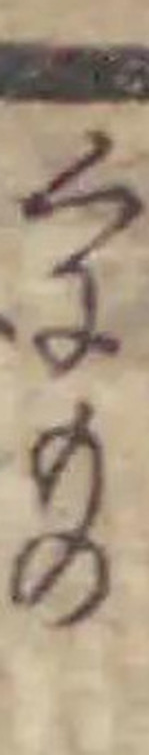くにもの
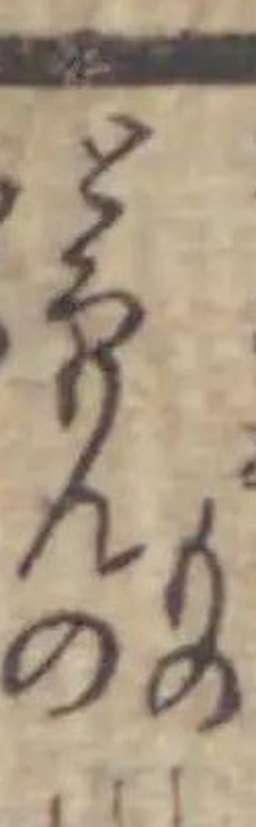とうもんの
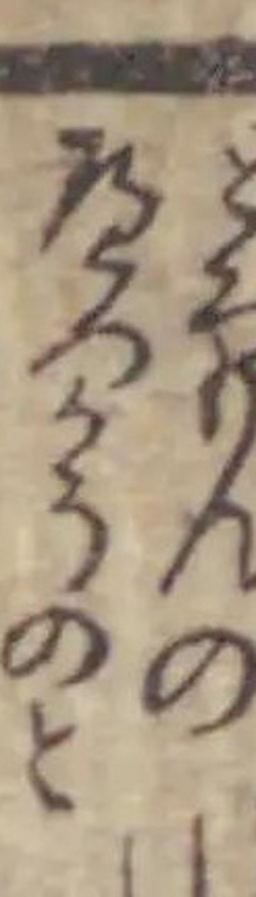へつかうのと
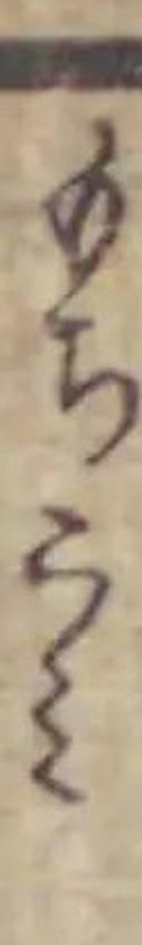もちこみ
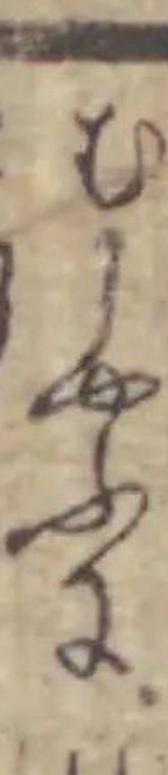むしやふに
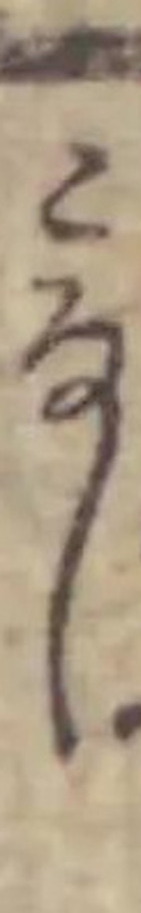こなし
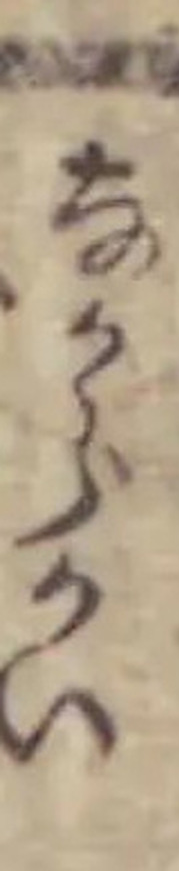なからかい
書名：間違月夜鍋 2巻
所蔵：国立国会図書館 National Diet Library, JAPAN
